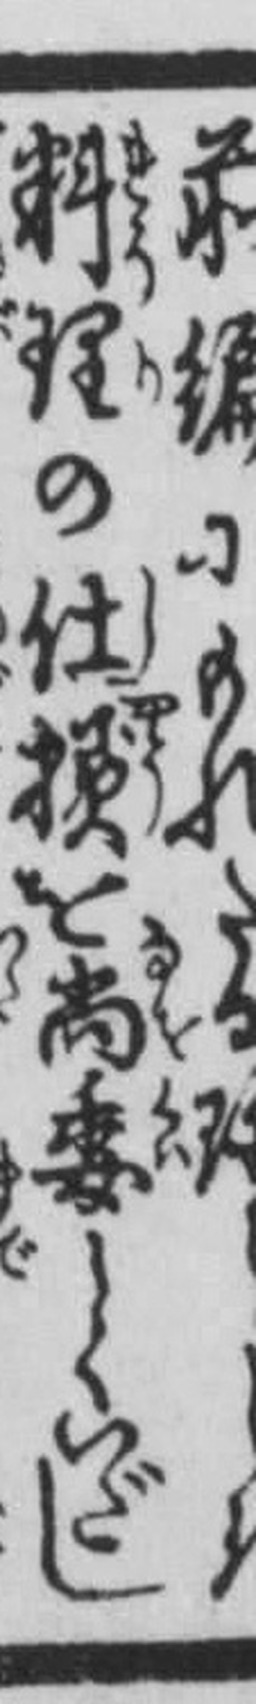料理の仕様を尚委しくいだし
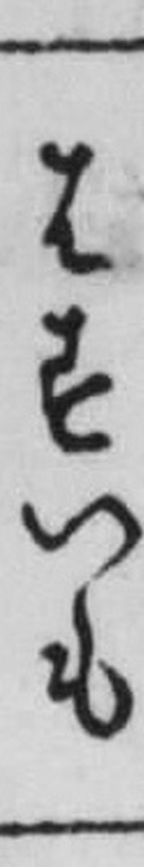はすいも
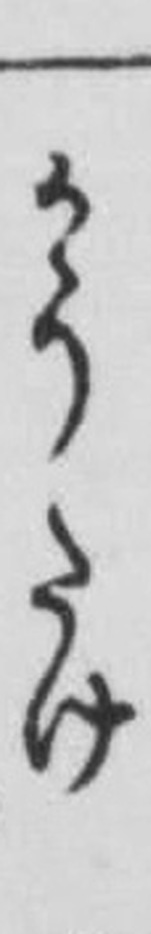かうたけ
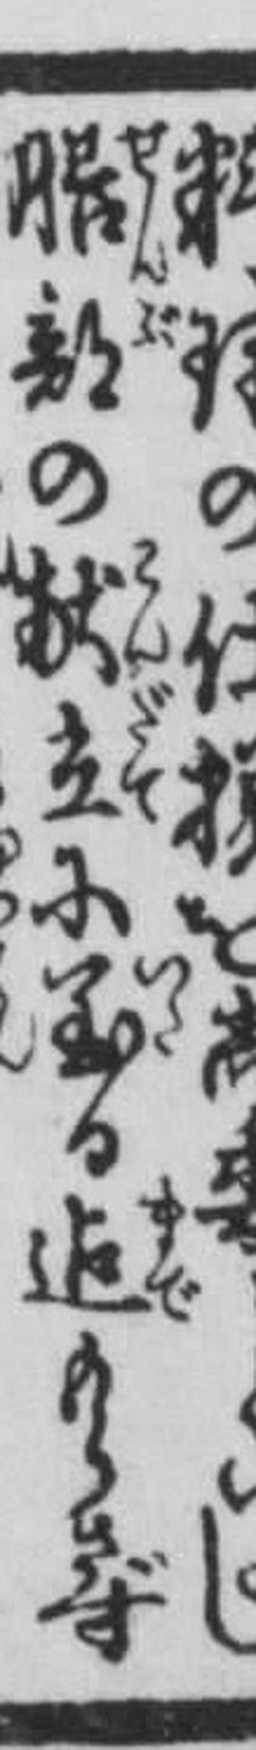膳部の献立に至る迄もらさず
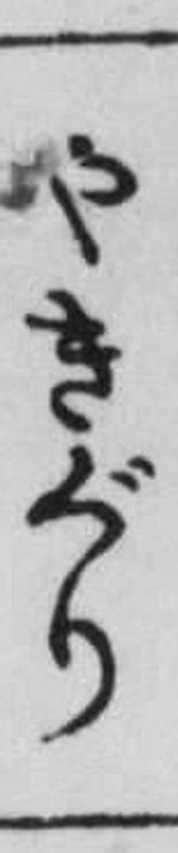やきぐり
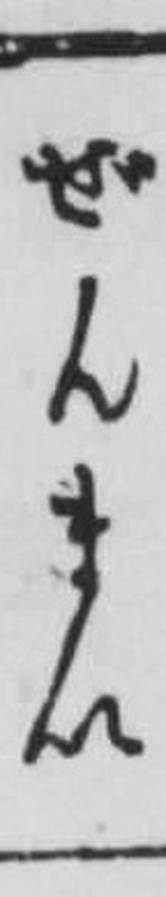ぜんまい
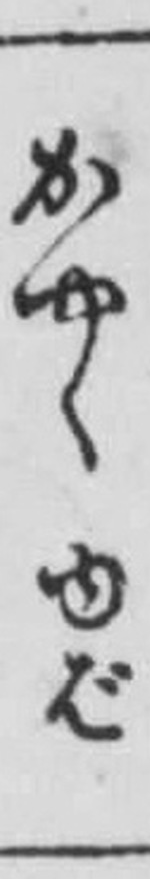かやくゆば
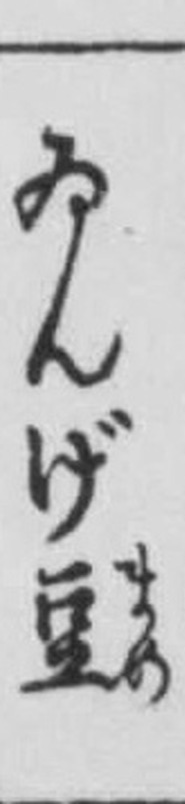ゐんげ豆
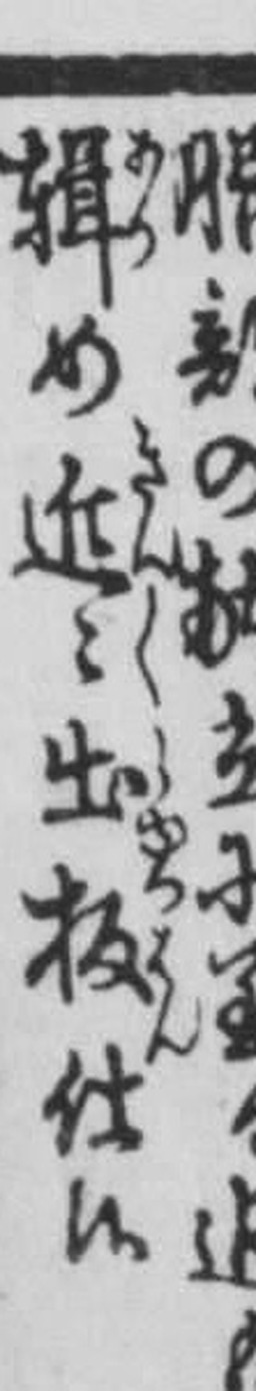輯め近々出板仕候
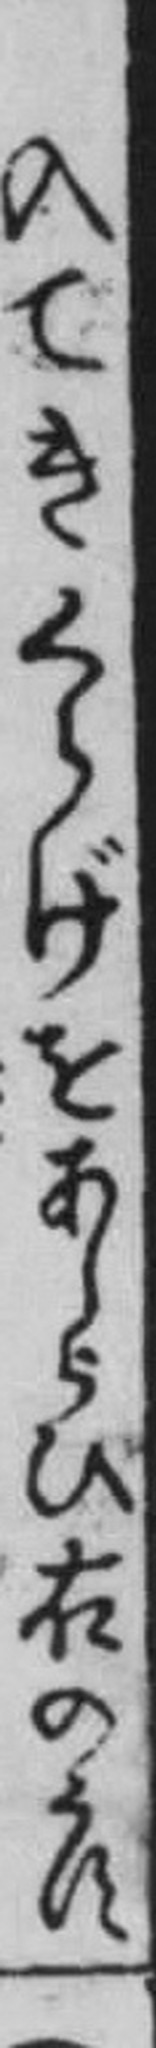入てきくらげをあしらひ右のうす
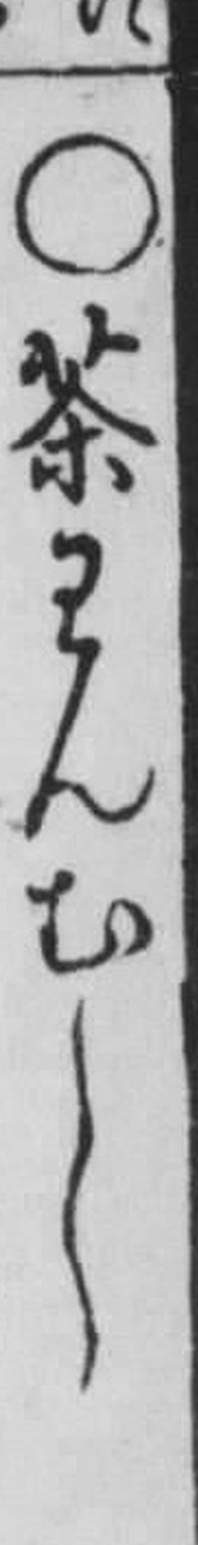〇茶わんむし
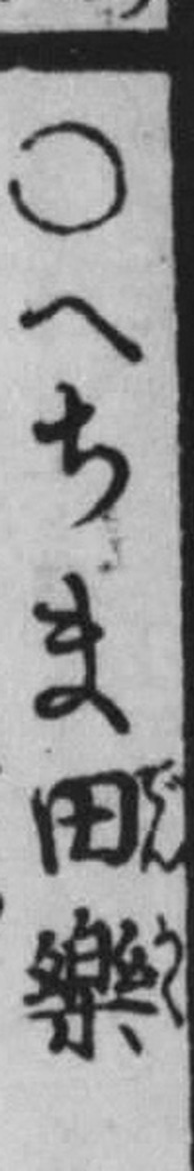〇へちま田楽
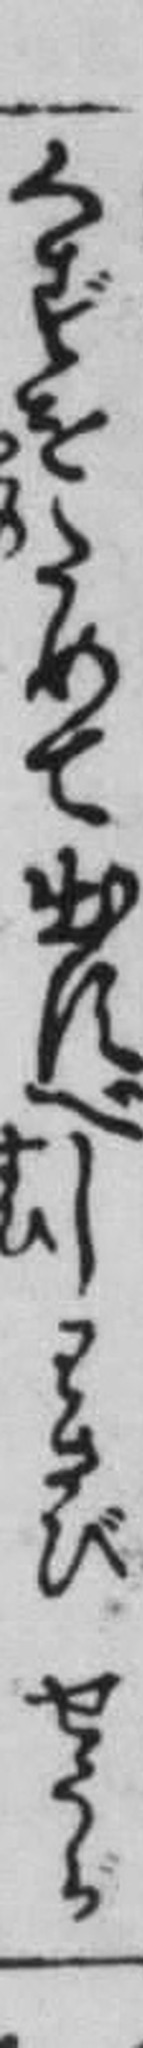くずをためて出すべしわさびせうが
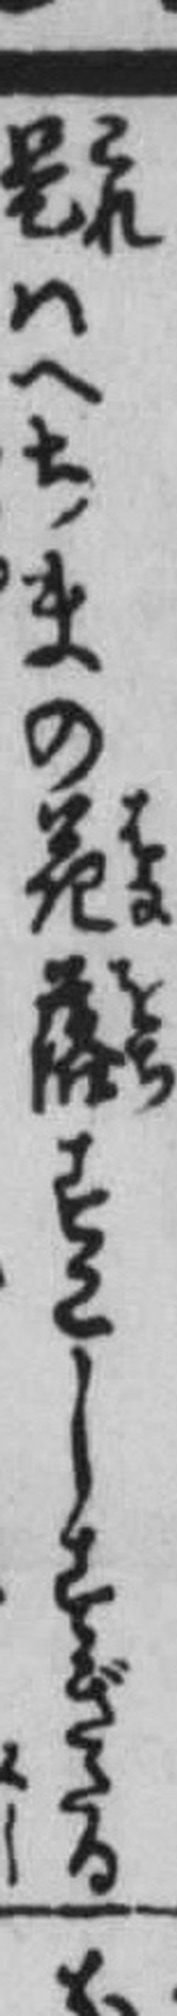是はへちまの花落すこしすぎたる
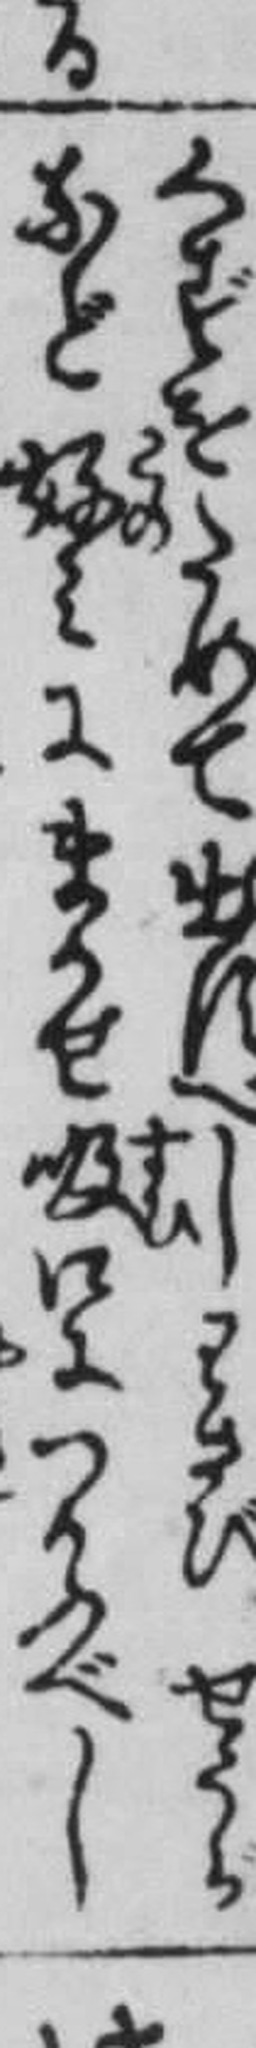など好みにまかせ吸口につかうべし
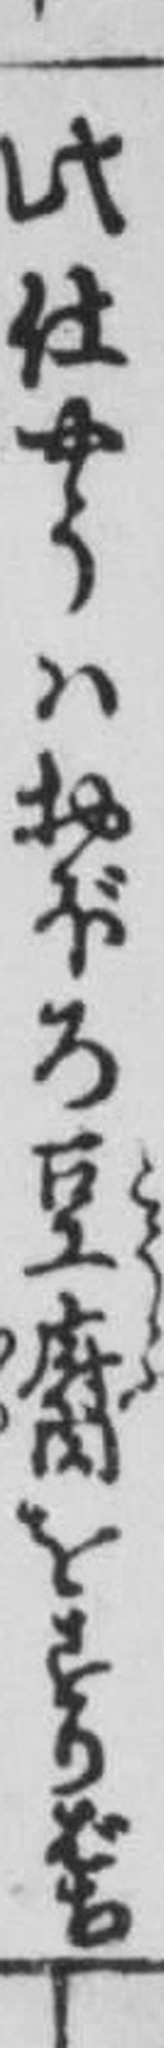此仕やうはおぼろ豆腐をすりばち
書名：日用重宝魚類精進/料理早工風
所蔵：大阪府立大学学術情報センター 国文学研究資料館
